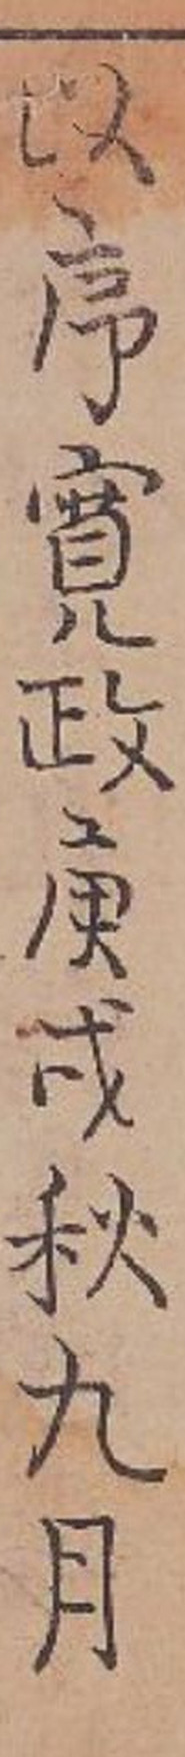以序寛政庚戌秋九月
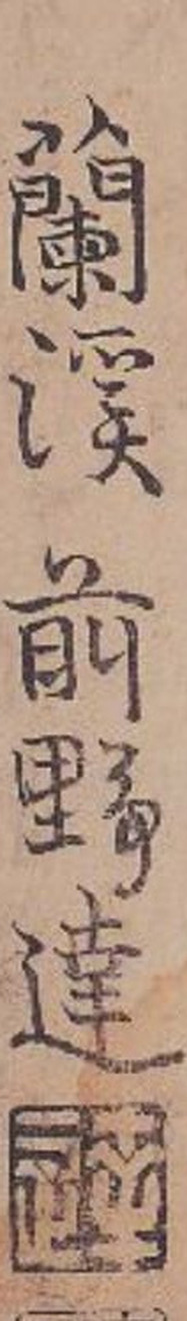蘭渓前野達印

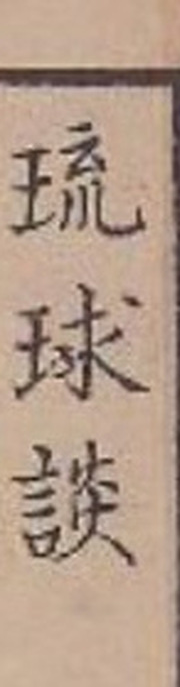琉球談
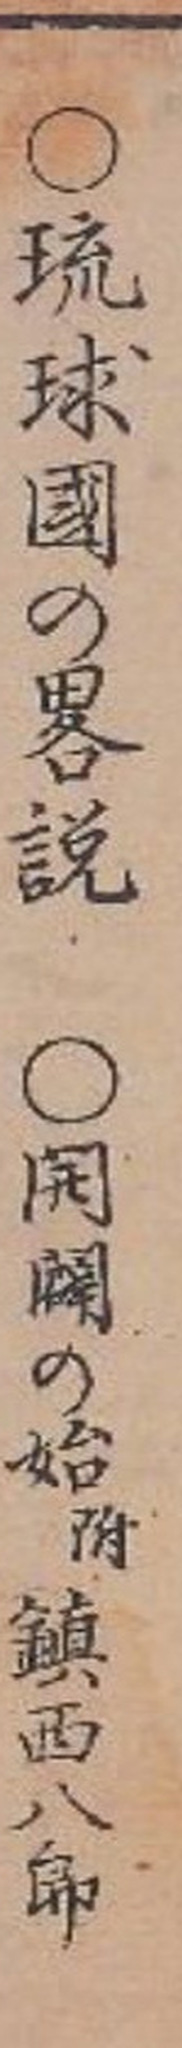○琉球国の略説○開闢の始附鎮西八郎
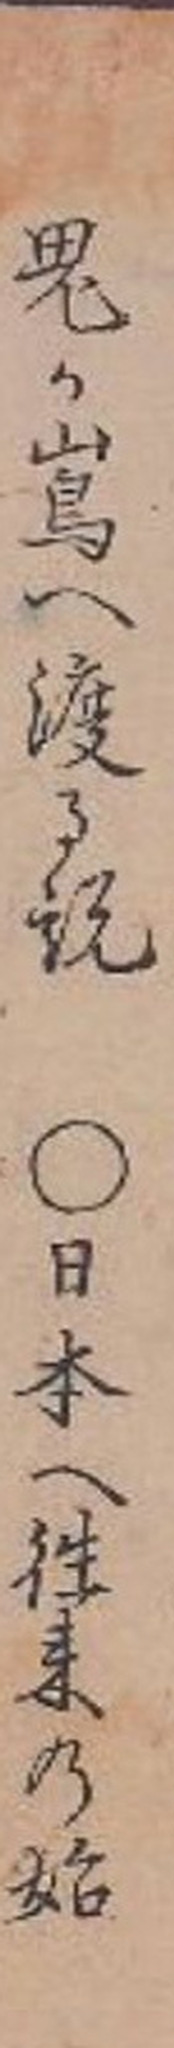鬼か島へ渡る記○日本へ往来の始
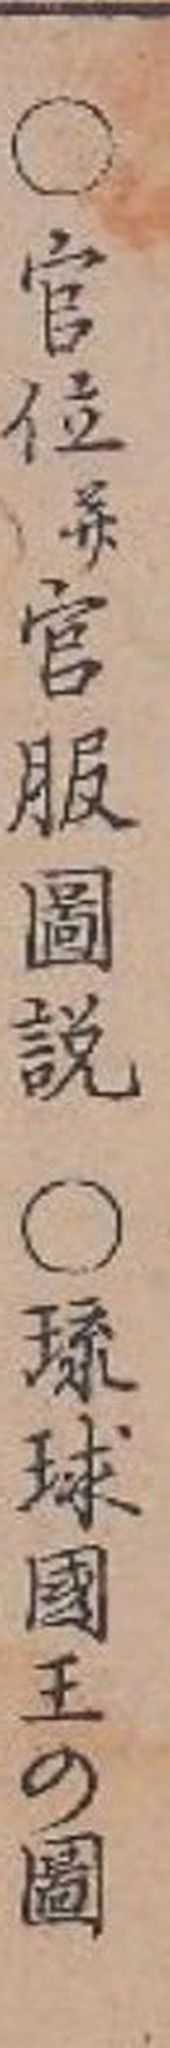○官位并官服図説○琉球国王の図

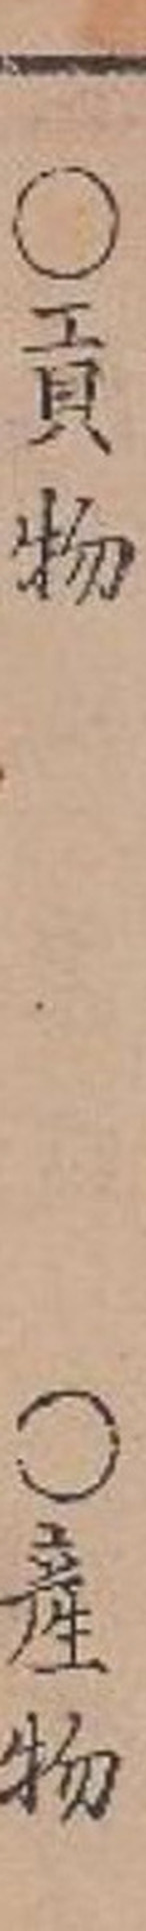○貢物○産物
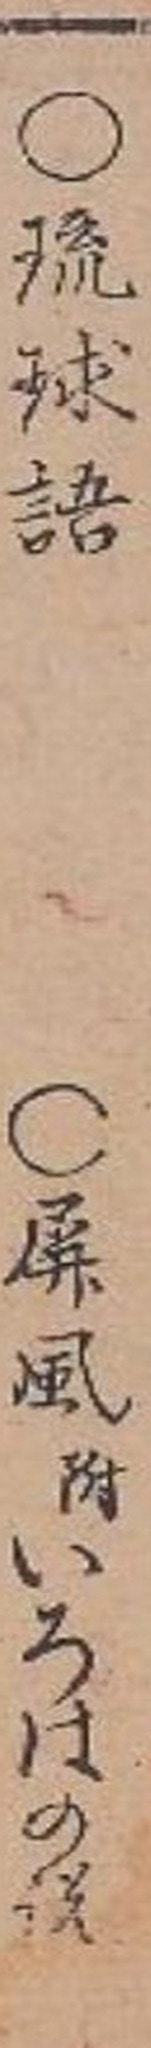○琉球語○屏風附いろはの説
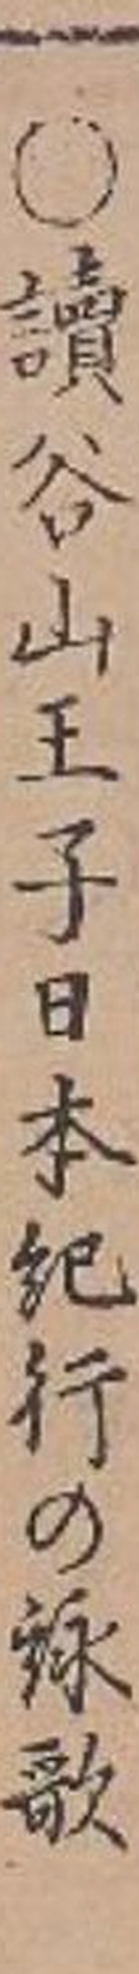○読谷山王子日本紀行の詠歌
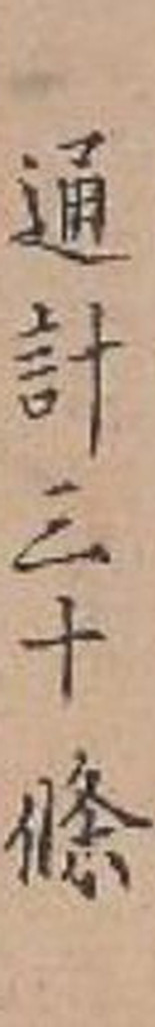通計三十条
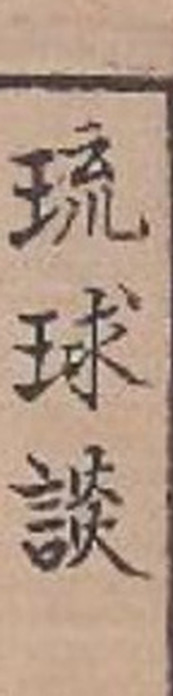琉球談
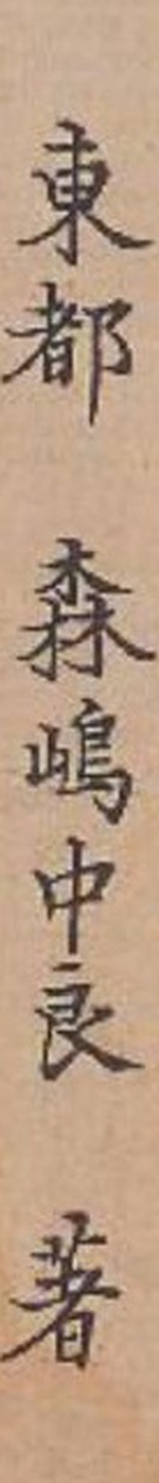東都森嶋中良著
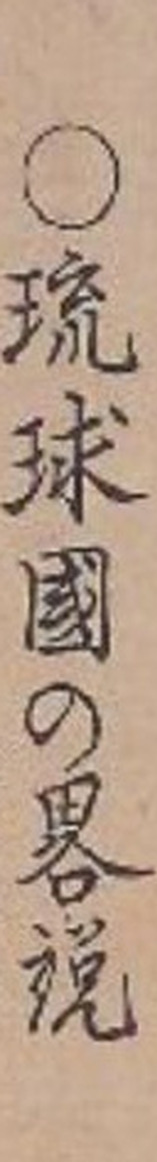○琉球国の略説
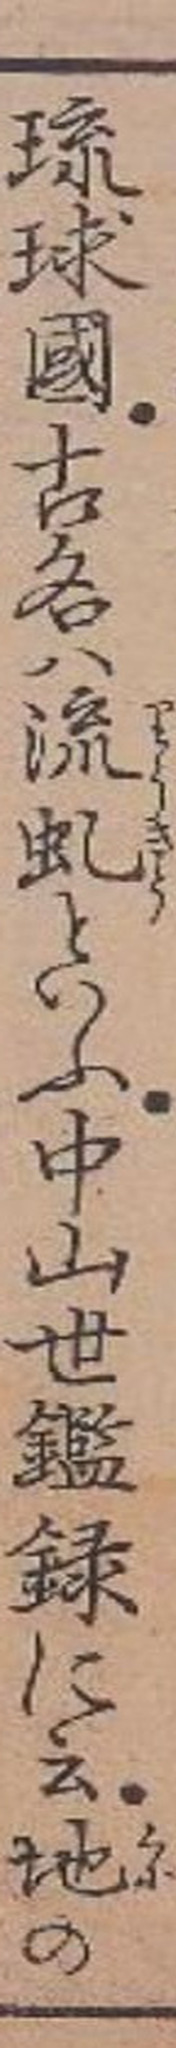琉球国、古名は流虬といふ、中山世鑑録に云、地の
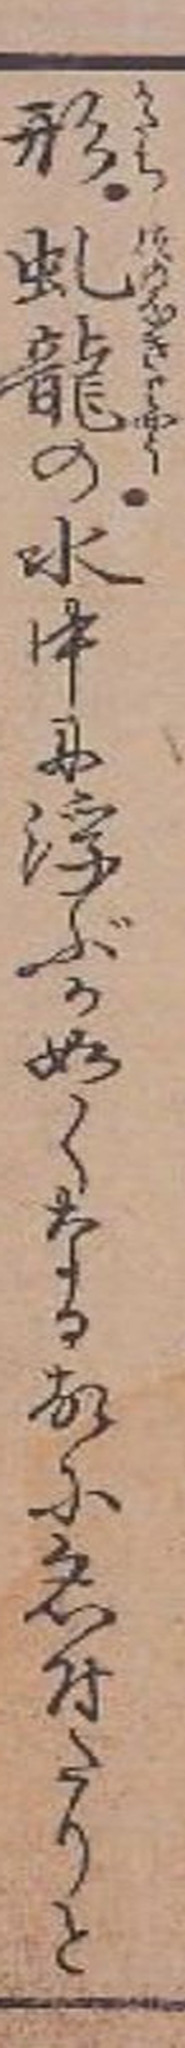形、虬龍の、水中に浮ぶか如くなる故に名付たりと
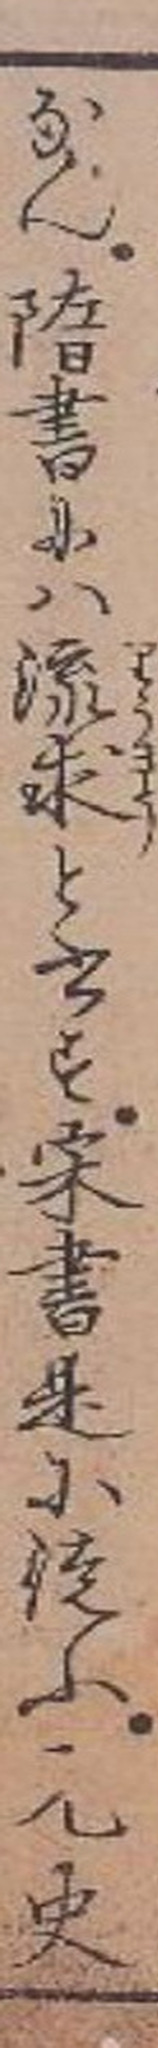なん、隋書には流求と書す、宋書是に徒ふ、元史
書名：琉球談
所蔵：University of the Ryukyus Library
